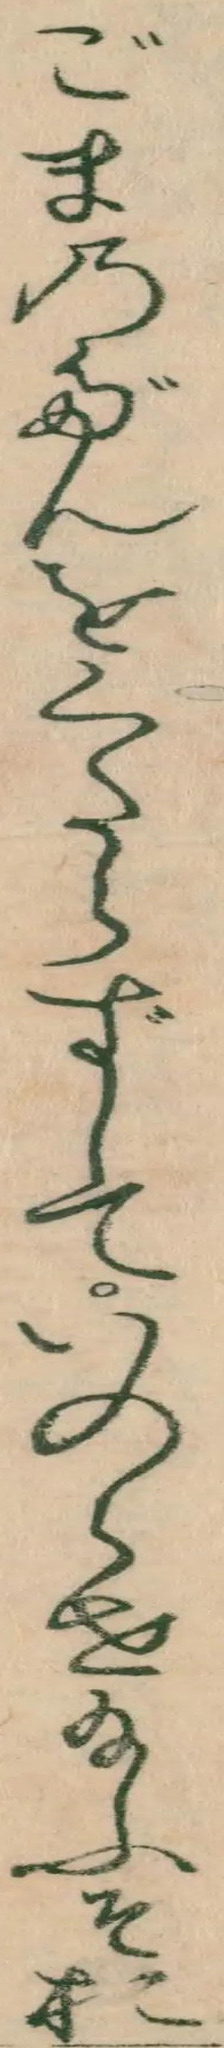ごまのだんをくたらずして。いのらせ給ふそお
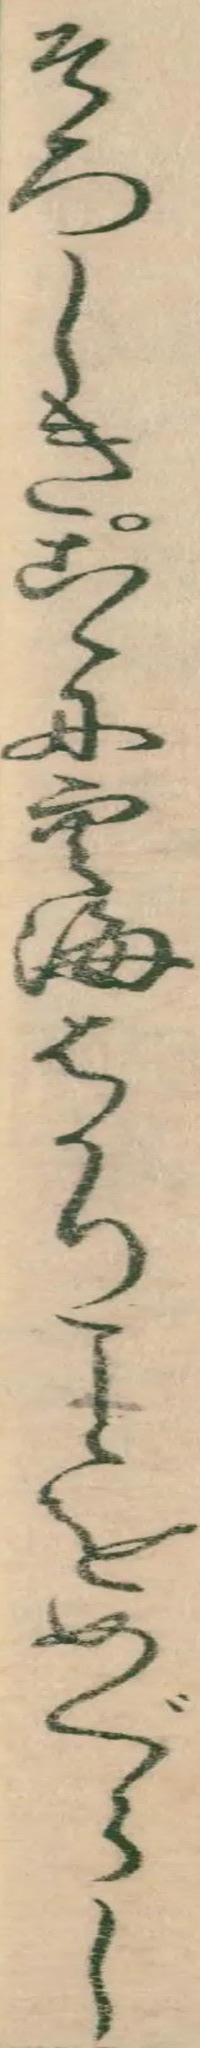そろしき。こゝに空海はかりことをめぐらし

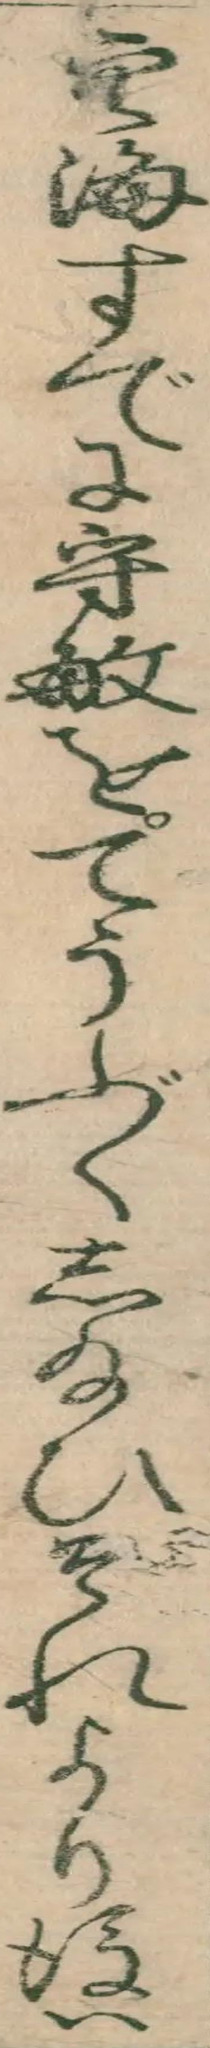空海すでに守敏を。ていぶくし給ひそれより後は
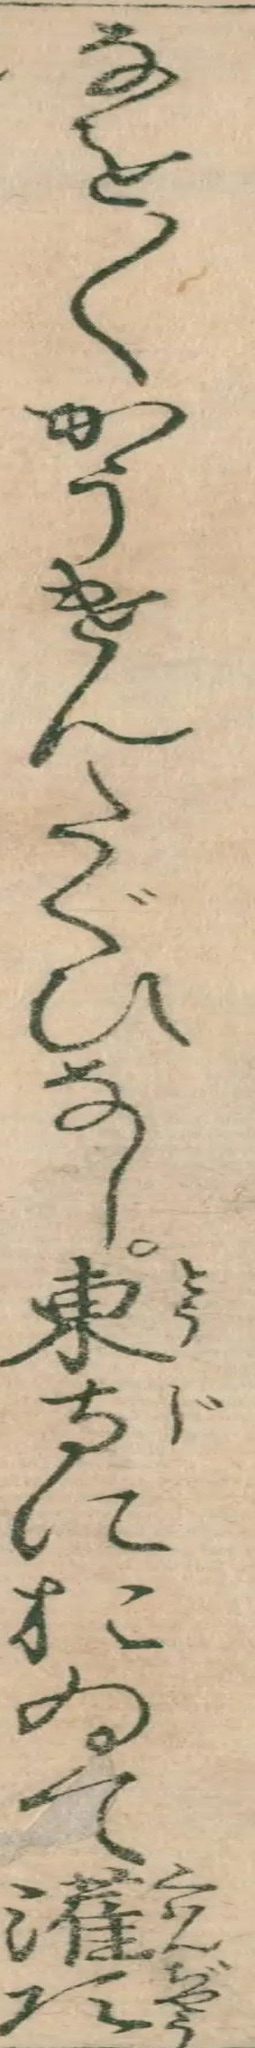なお〳〵かうけんたぐひなし。東寺におゐて灌頂
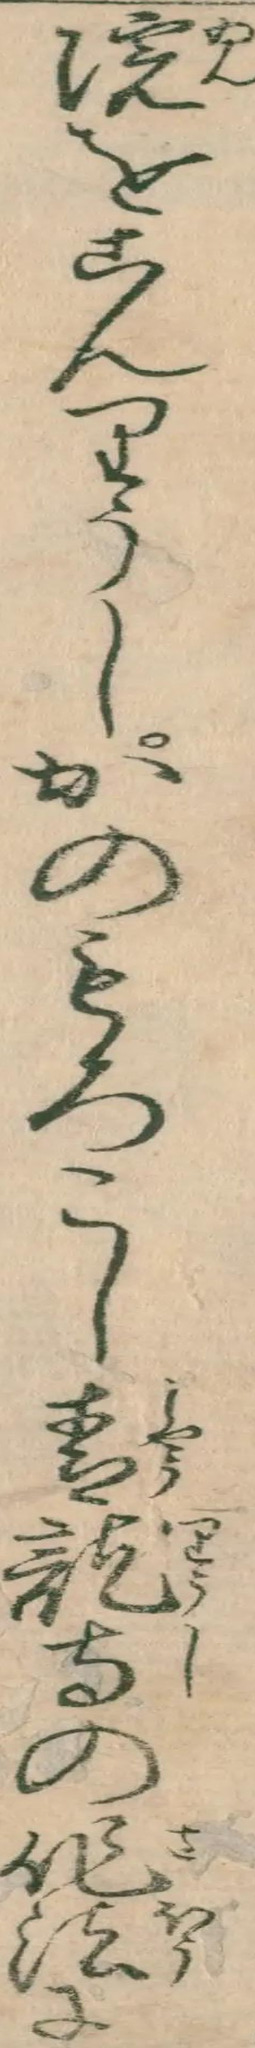院をこんりうし。かのもろこし青龍寺の作法に
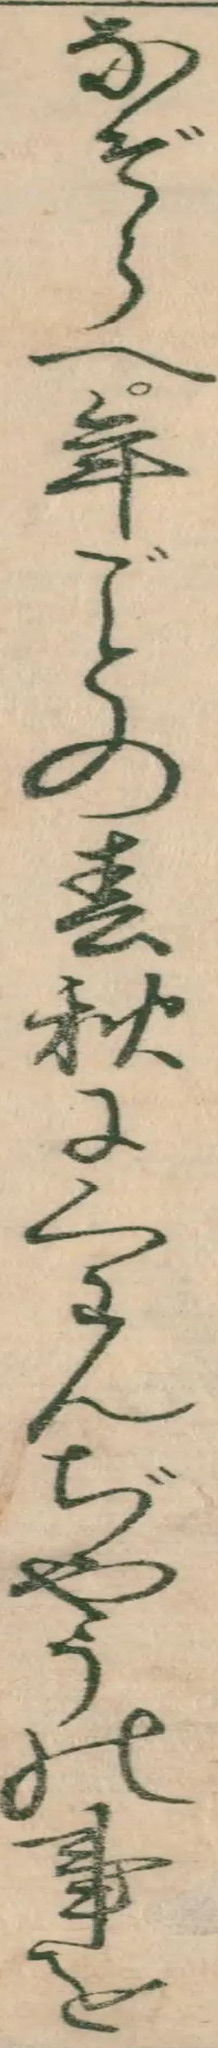なぞらへ。年ごとの春秋にくわんぢやうの事を
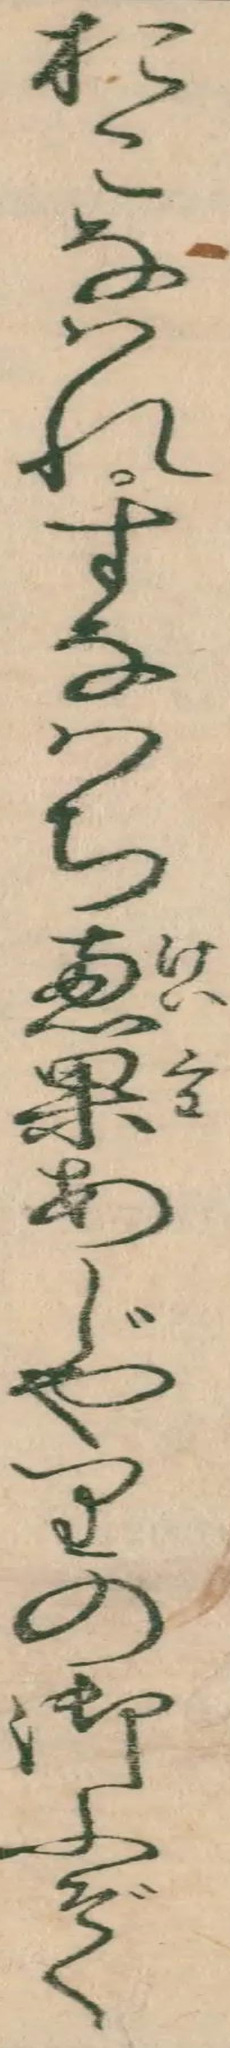おこなはれ。すなはち恵果あじやりの御ふぞく
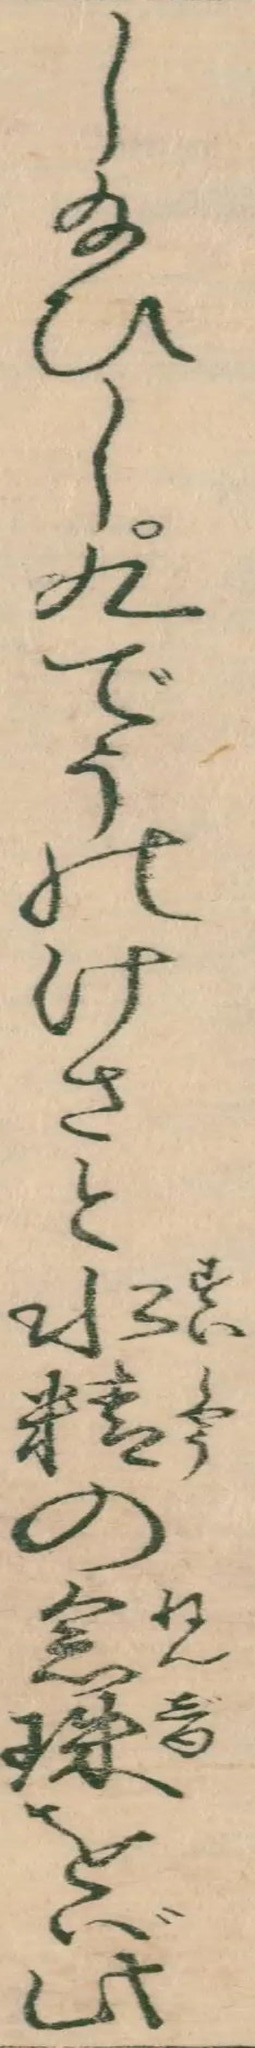し給ひし。九でうのけさと水精の念珠をば此
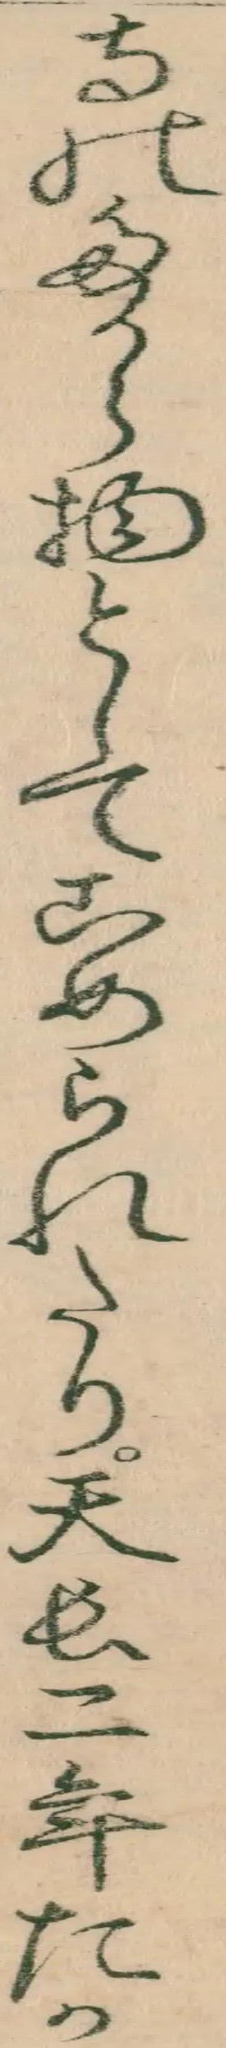寺のたから物としてこめられたり。天長二年たか
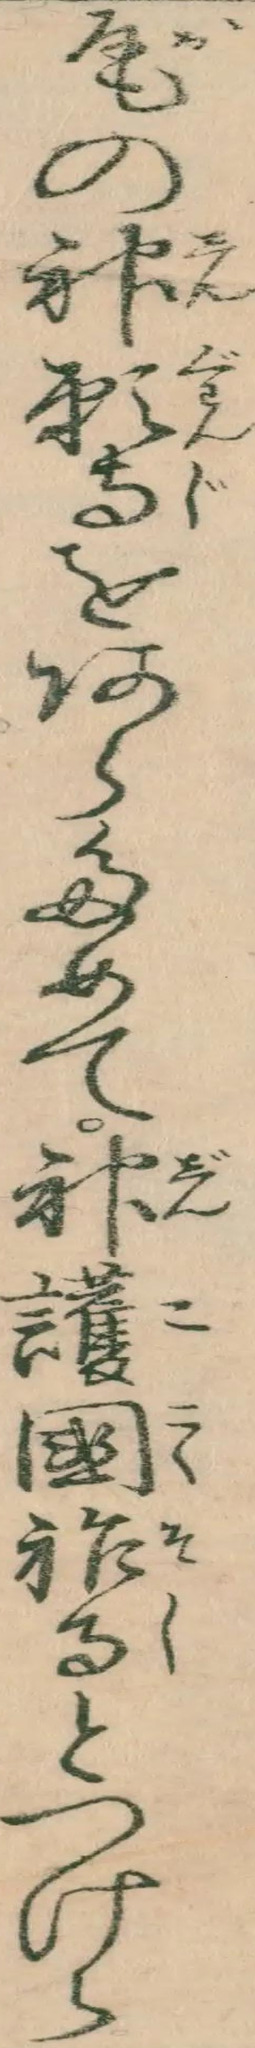尾の神願寺をあらためて。神護国祚寺とつけら
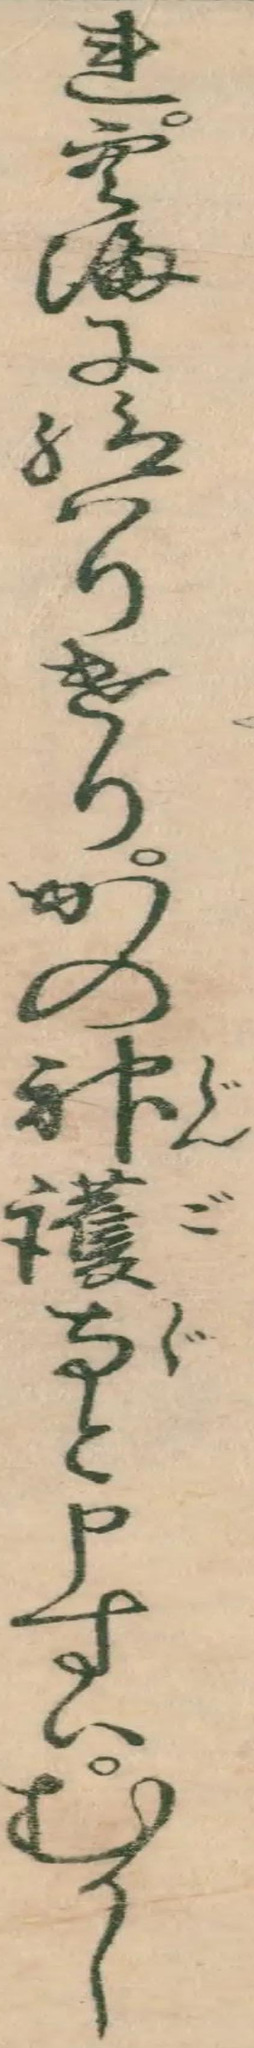れ。空海に給はりけり。かの神護寺と申すは。むかし
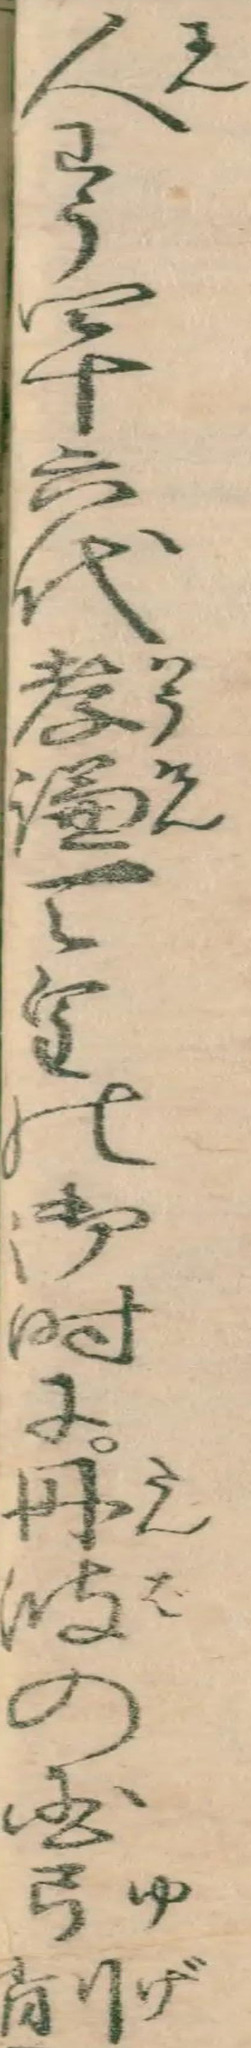人わう四十六代孝謙天皇の御時に。丹波の国弓削
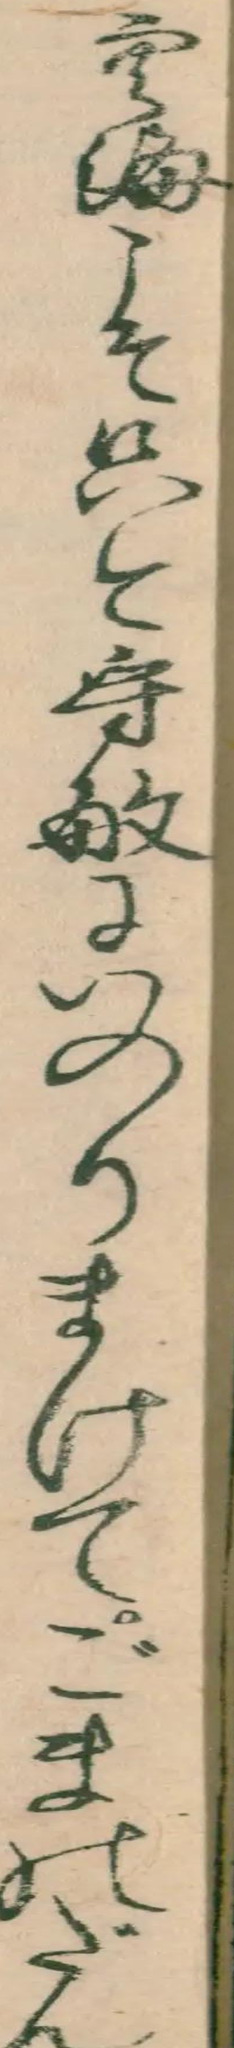空海こそ只今守敏にいのりまけて。ごまのだん
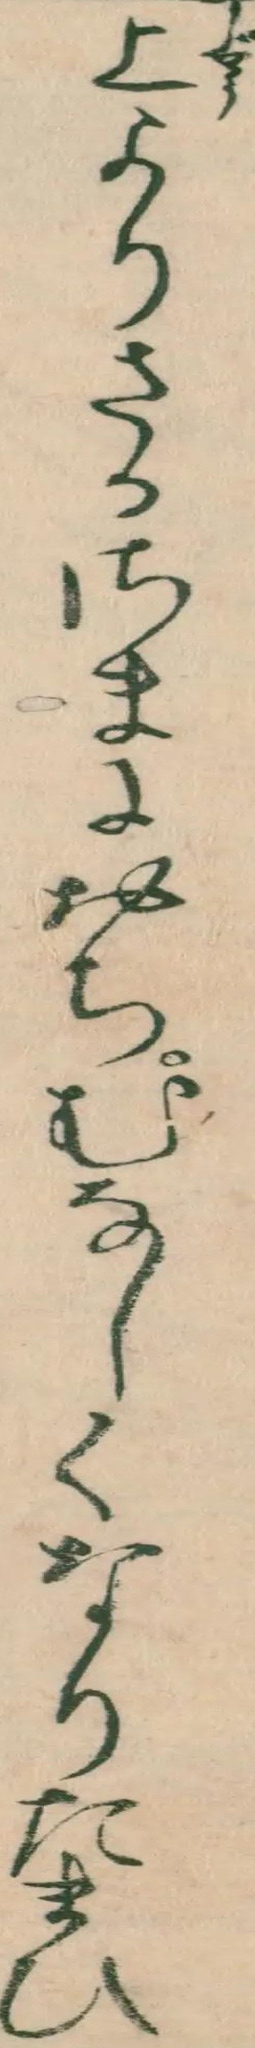上よりさかさまにおち。むなしくなりたまひ
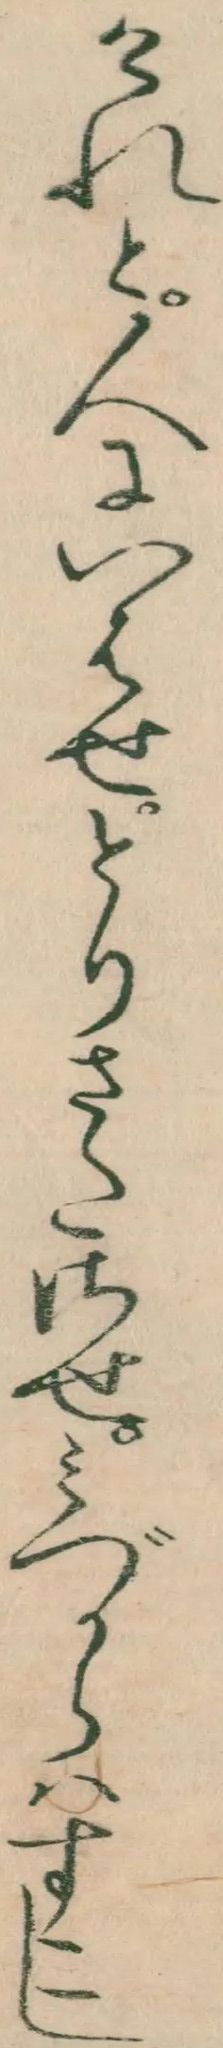けれと。人にいはせ。とりさたさせ。みづからはすこし
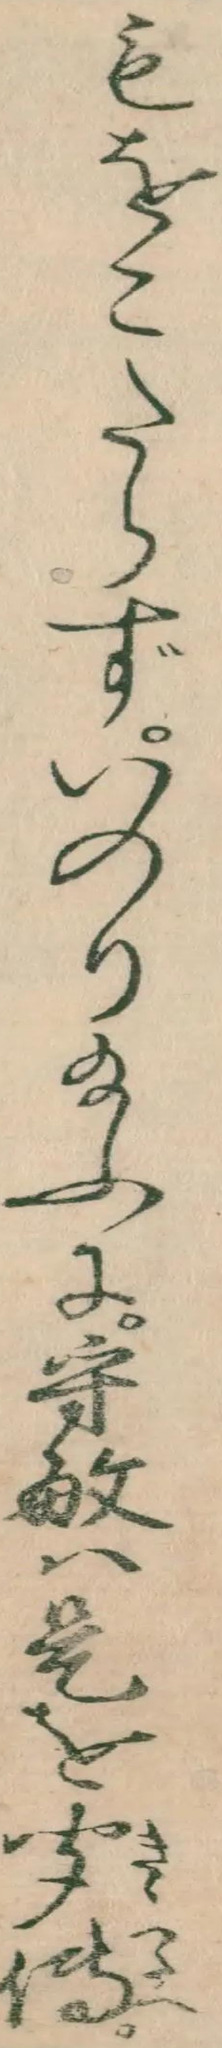もおをたらず。いのり給ふに。守敏は是を聞伝。
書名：弘法大師御本地 3巻. [3]
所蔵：国立国会図書館 National Diet Library, JAPAN
